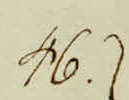46.
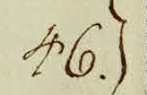46.
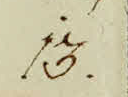13.
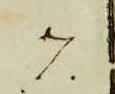7.
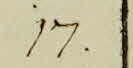17.
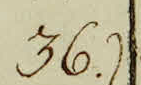36.
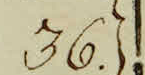36.
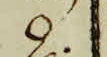9.
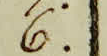6.
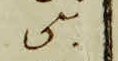5.
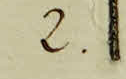2.
